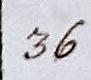36
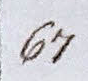67
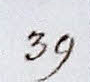39
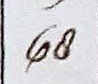68
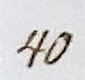40
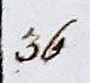36
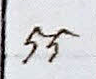55
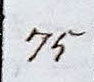75
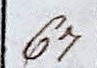67
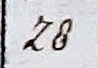28
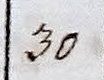30
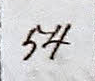54
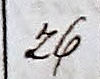26
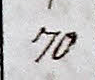70
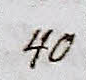40
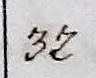32
